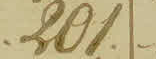201.
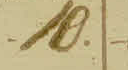10.
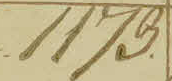1173.
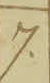7.
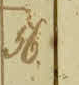56.
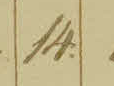14.
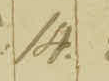14.
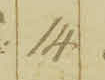14
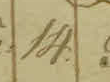14.
